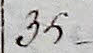35
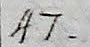47
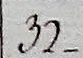32
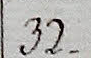32
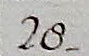28
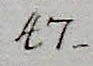47
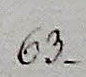63
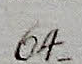64
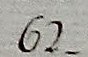62
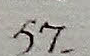57
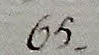65
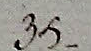35
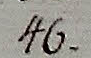46
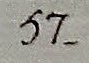57
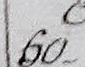60
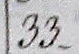33
